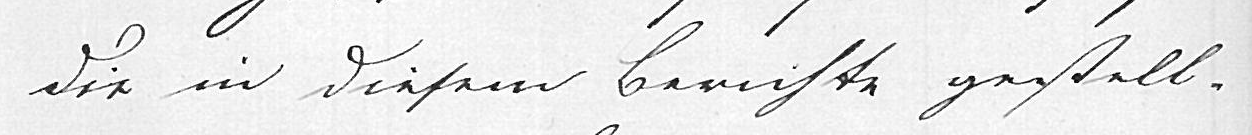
die in diesem Berichte gestell-
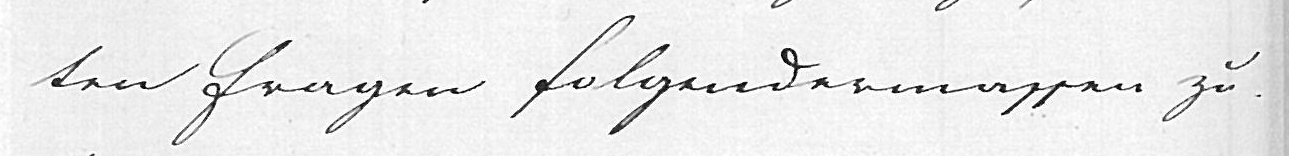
ten Fragen folgendermassen zu-
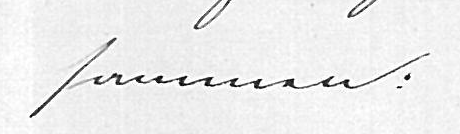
sammen.
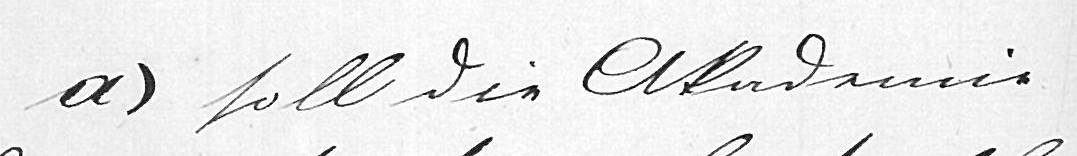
a) Soll die Akademie
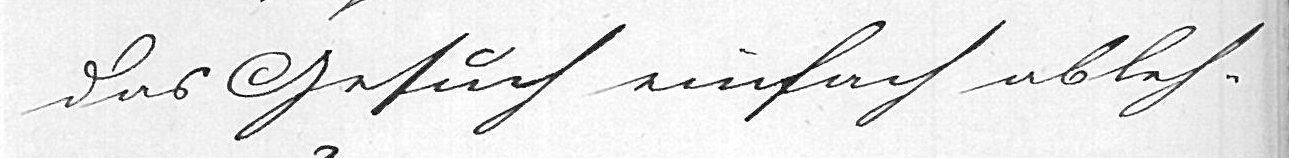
das Gesuch einfach ableh-
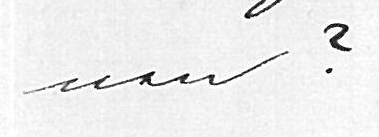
nen?
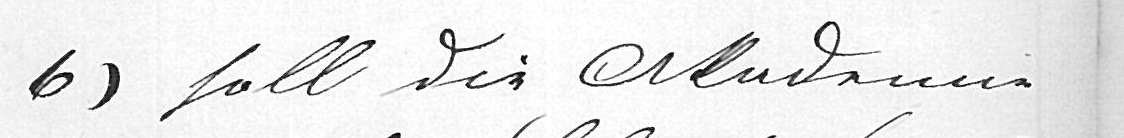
b) Soll die Akademie
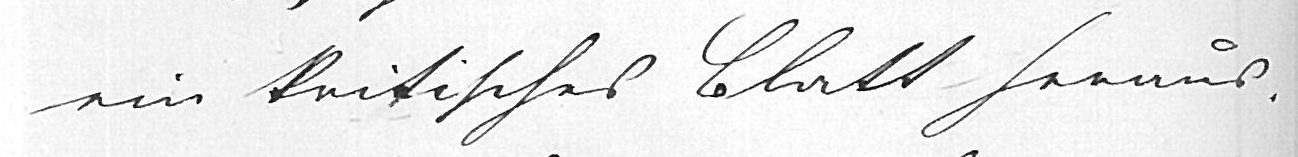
ein kritischen Blatt heraus-
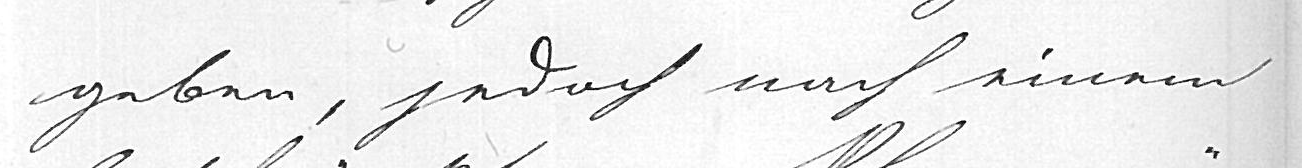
geben, jedoch nach einem
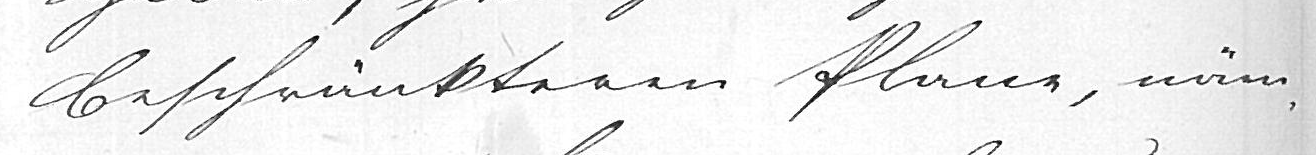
beschränkteren Plane, näm-
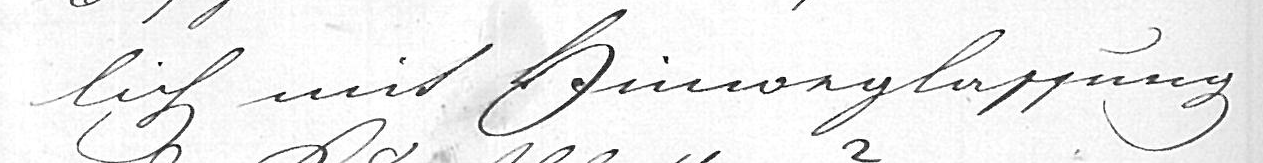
lich mit Hinweglassung
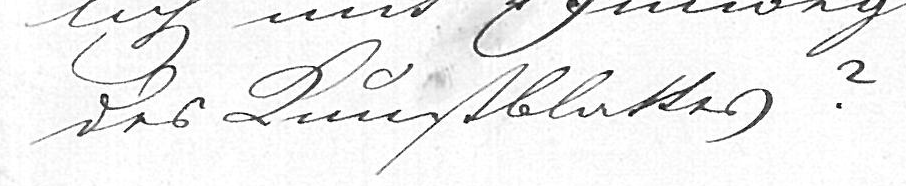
des Kunstblattes?
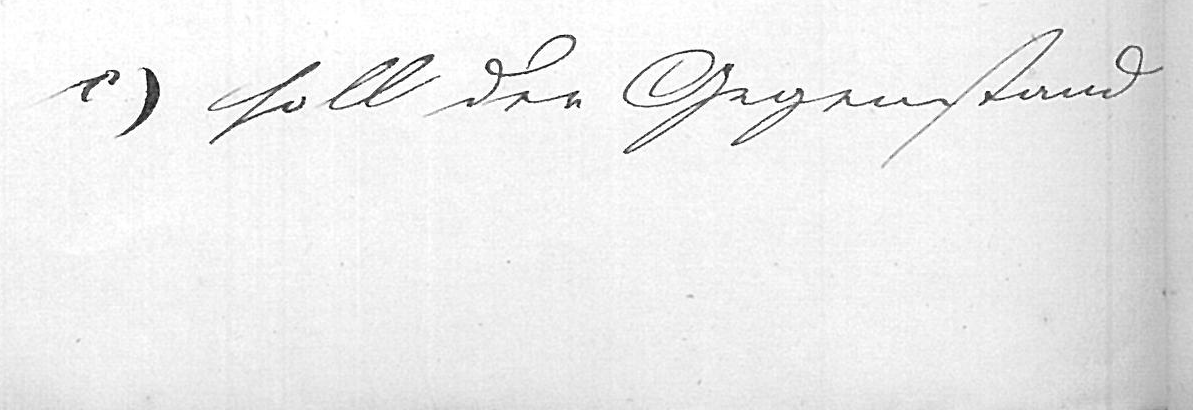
c) Soll der Gegenstand
